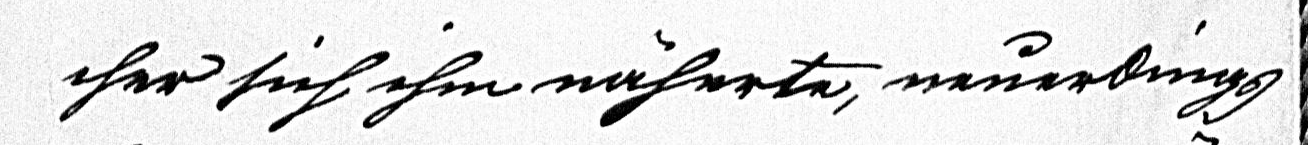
cher sich ihm näherte, neuerdings
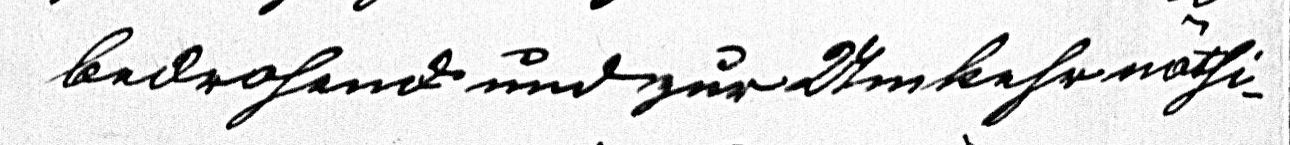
bedrohend und zur Umkehr nöthi¬
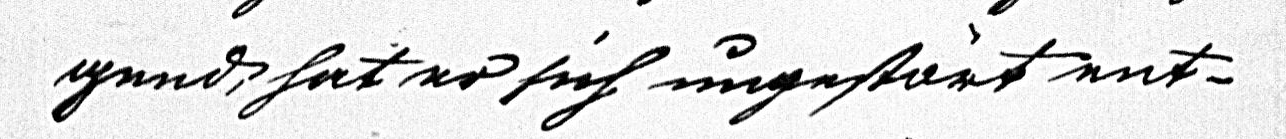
gend, hat er sich ungestört ent¬
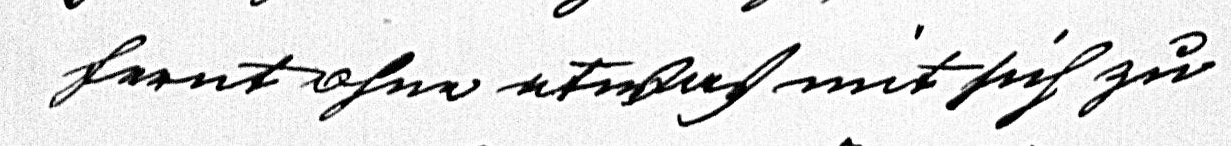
fernt ohne etwas mit sich zu
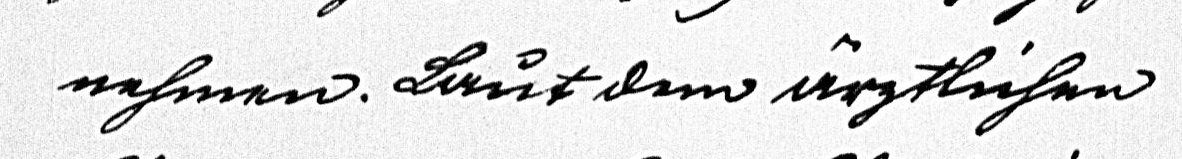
nehmen. Laut dem ärztlichen
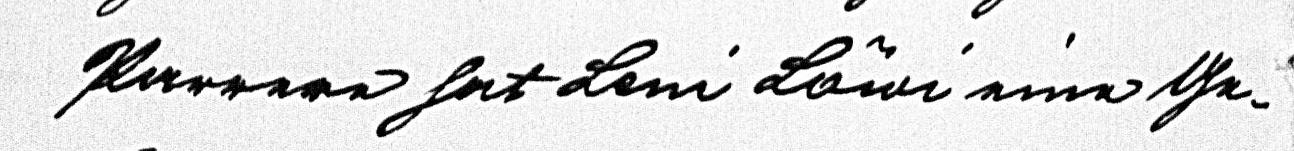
Parrere hat Leni Löwi eine Ge¬
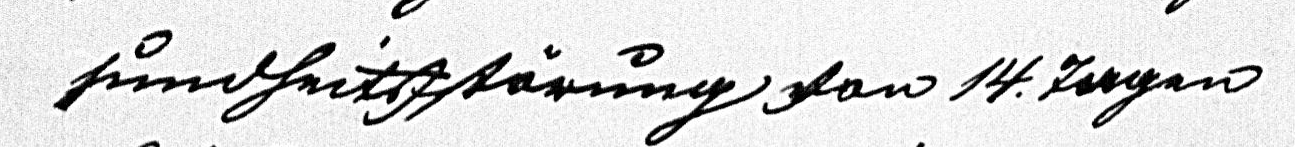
sundheitsstörung von 14. Tagen
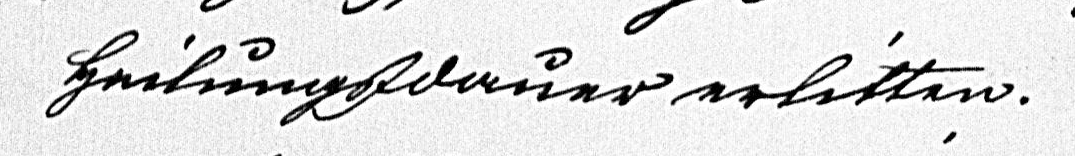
Heilungsdauer erlitten.
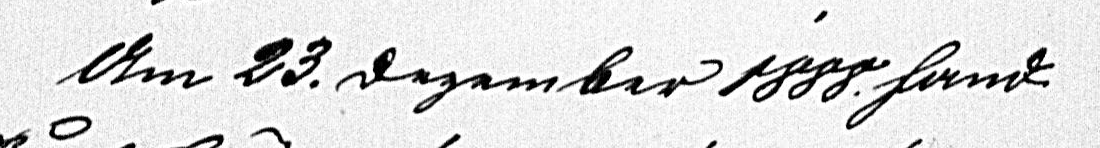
Am 23. Dezember 1888. Hand
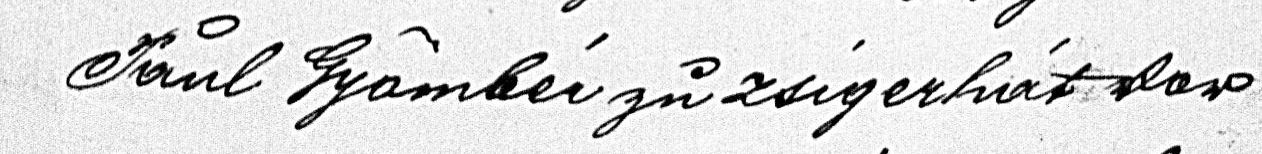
Paul Gyömbér zu zsigerhát vor
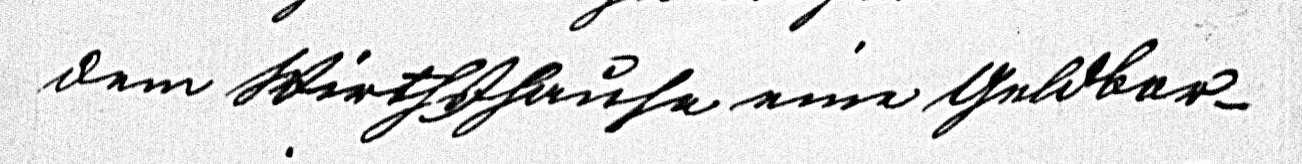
dem Wirthshause eine Geldbor¬
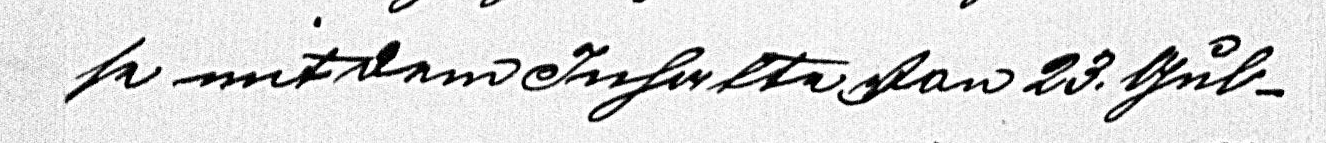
se mit dem Inhalte von 23 Gul¬
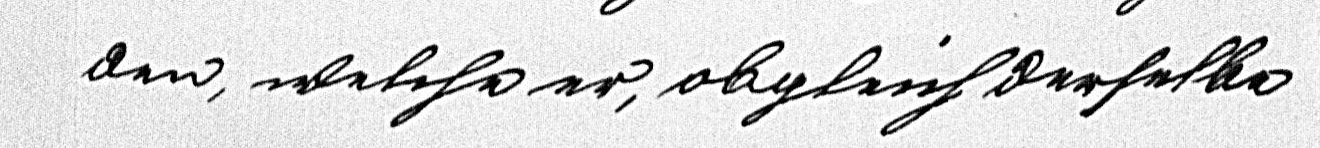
den, welche er, obgleich derselbe
